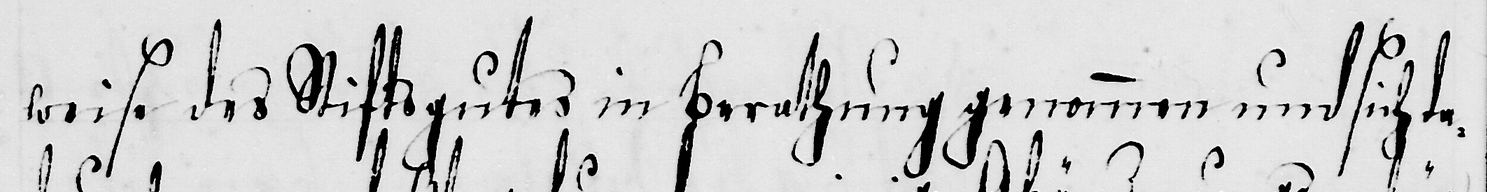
weise des Stiftsgutes in Berathung genommen und sich d¬
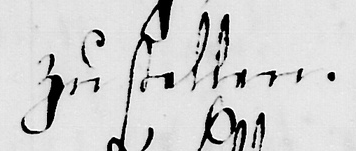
zu stellen.
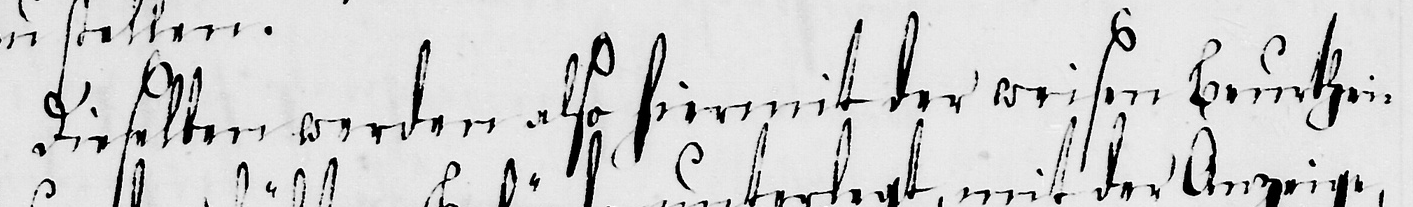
Dieselben werden also hiermit der weisen Beurthei¬
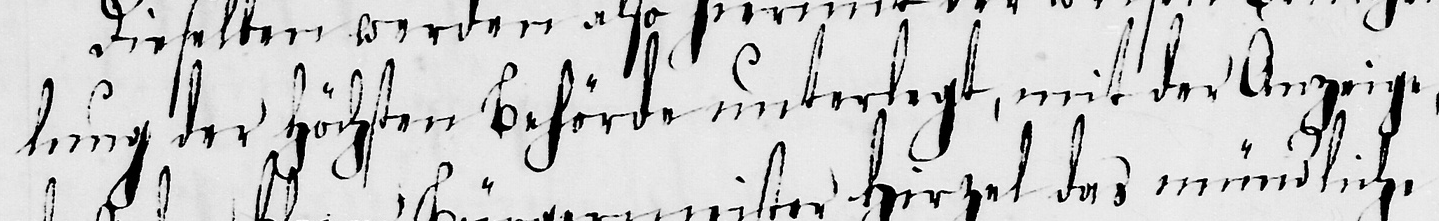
lung der Höchsten Behörde unterlegt, mit der Anzei¬
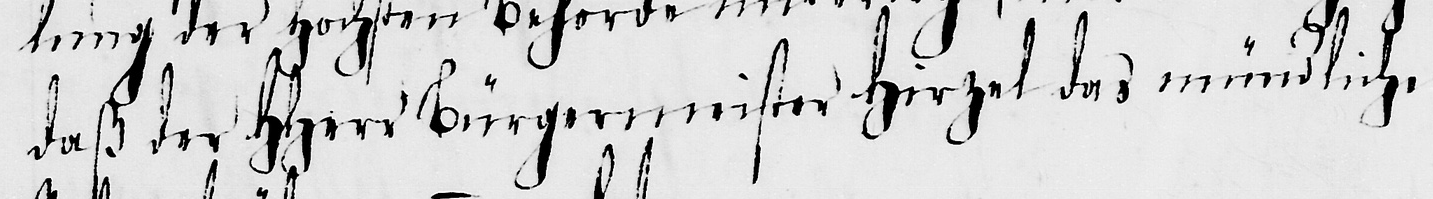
daß der HHerr Bürgermeister Hirzel das mündliche
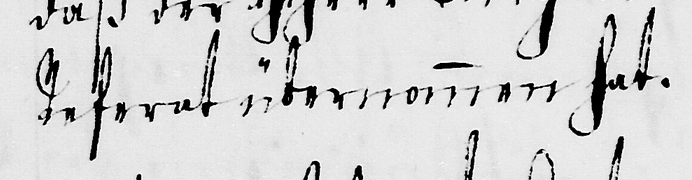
Referat übernommen hat.
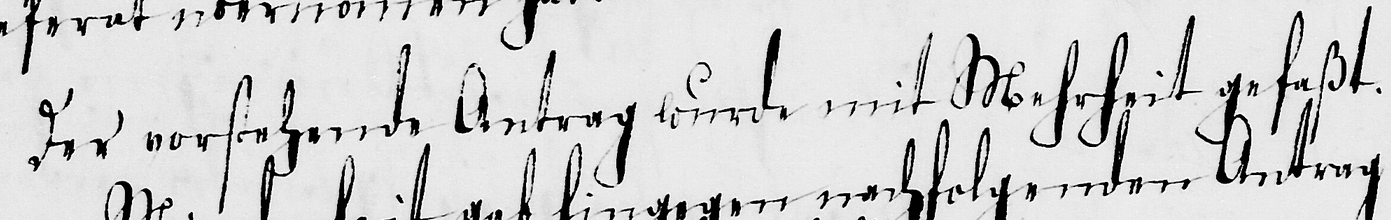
Der vorstehende Antrag wurde mit Mehrheit gefaßt.
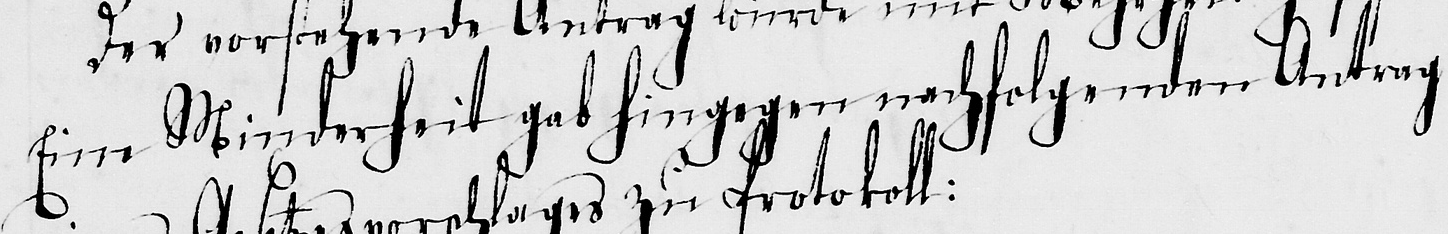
Eine Minderheit gab hingegen nachfolgenden Antrag
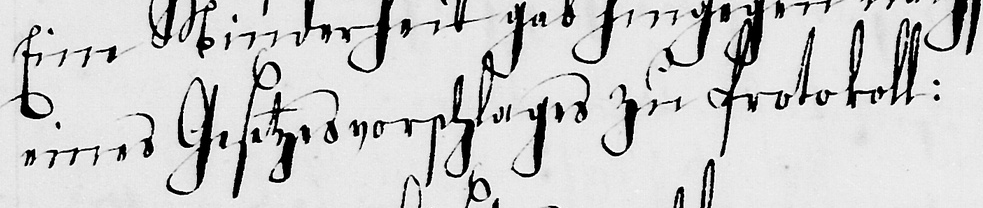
eines Gesetzesvorschlages zu Protokoll:
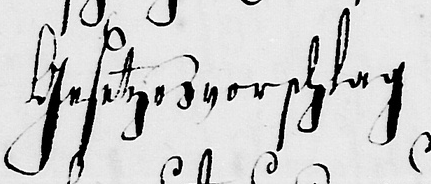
Gesetzesvorschlag
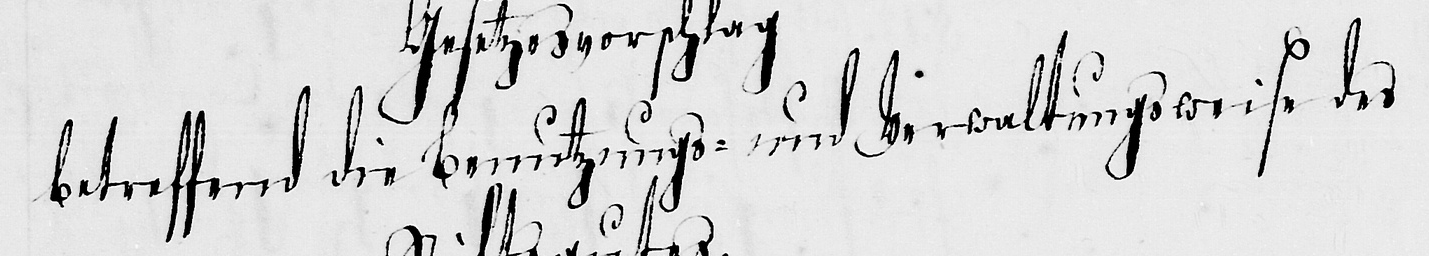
betreffend die Benutzungs- und Verwaltungsweise des
